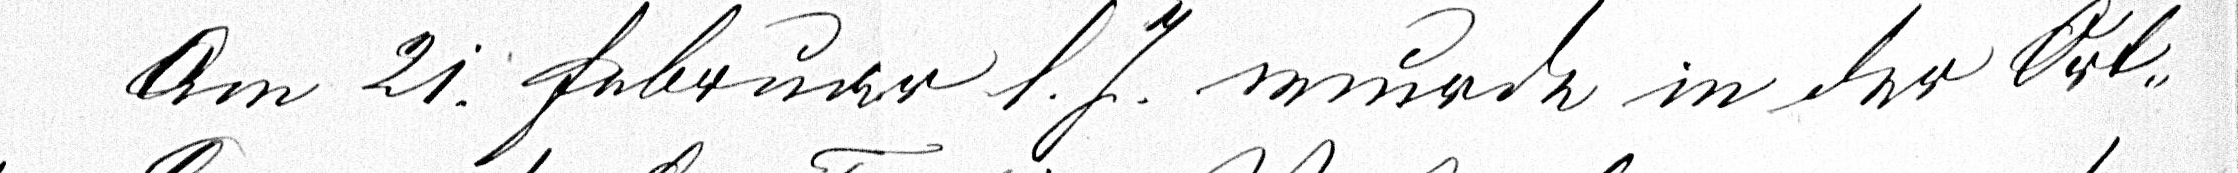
Am 21. Februar l.J. wurde in der Ort¬
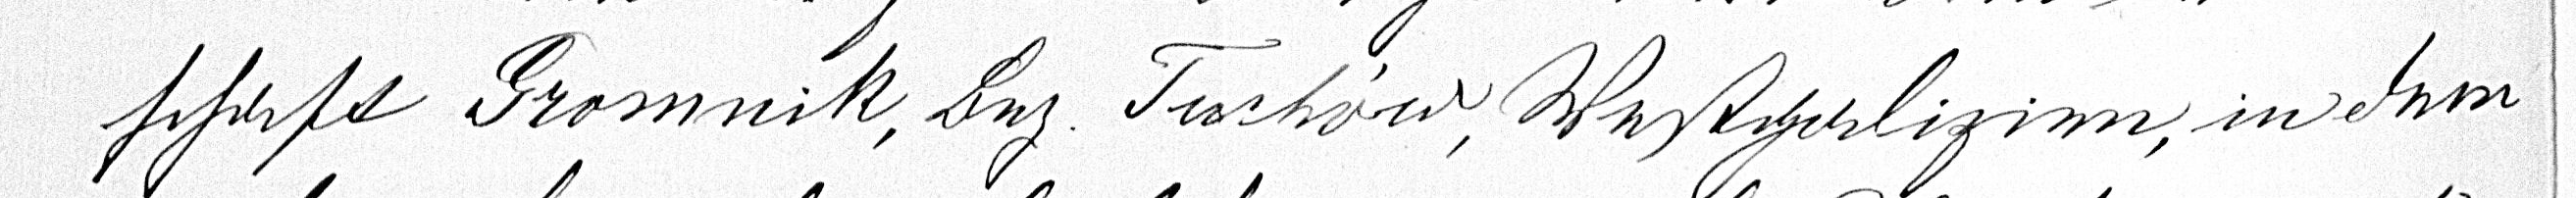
schaft Gromnik, Bez. Tuchów, Westgalizien, in dem
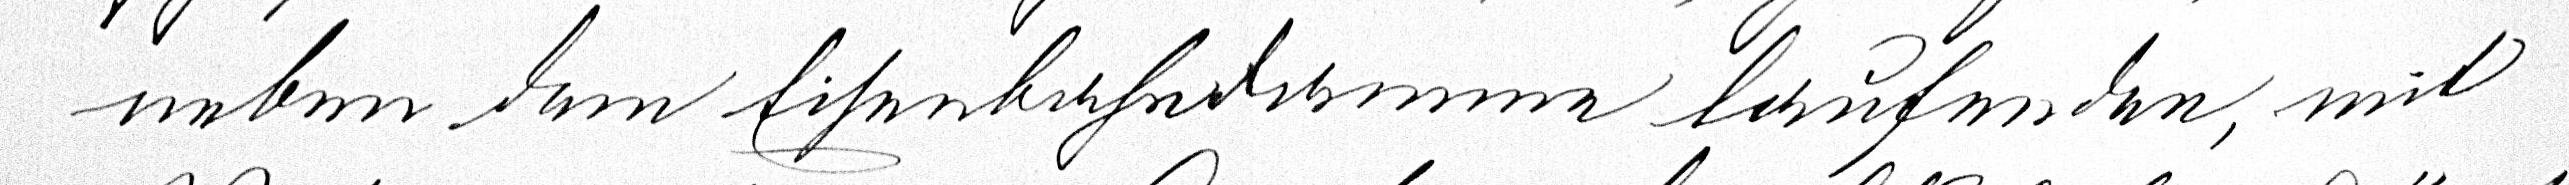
neben dem Eisenbahndamme laufenden, mit
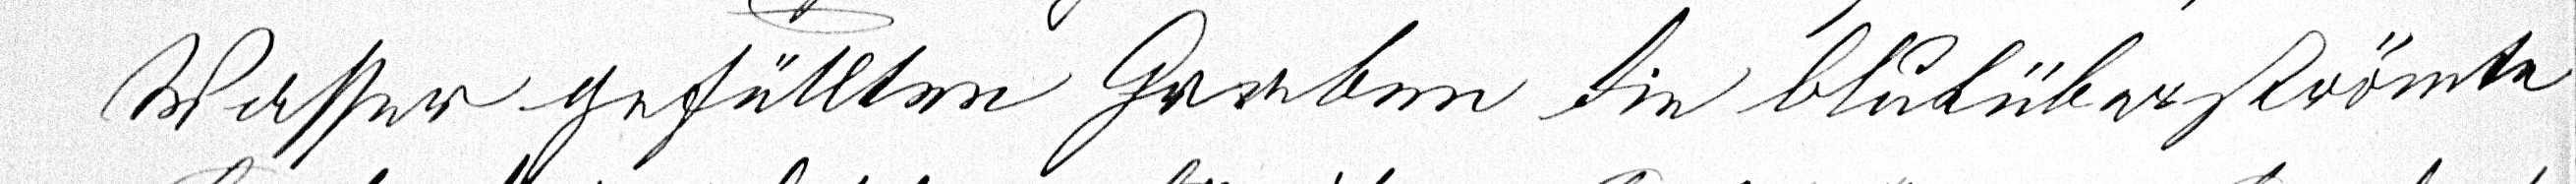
Wasser gefüllten Graben die blutüberströmte
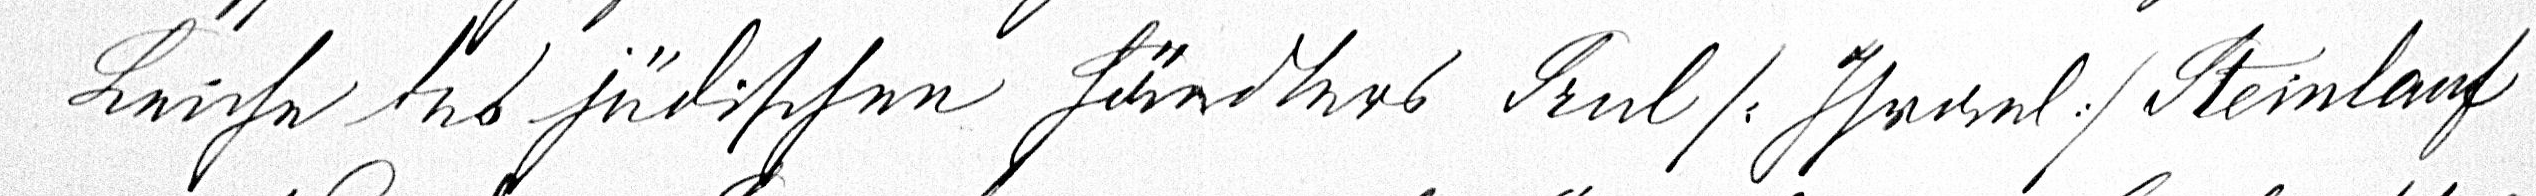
Leiche des jüdischen Händlers xx /:Israel:/ Steinlauf
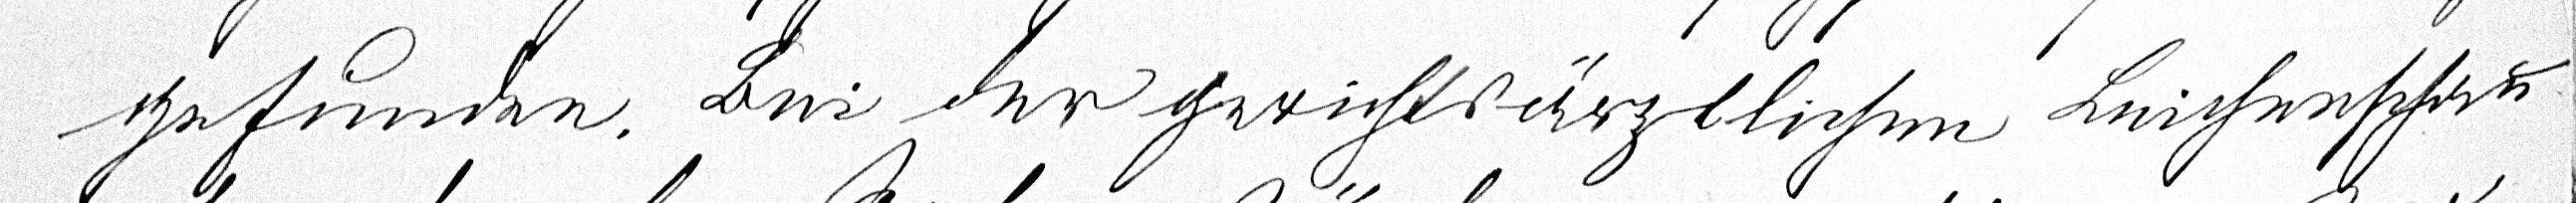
gefunden. Bei der gerichtsärztlichen Leichenschau¬
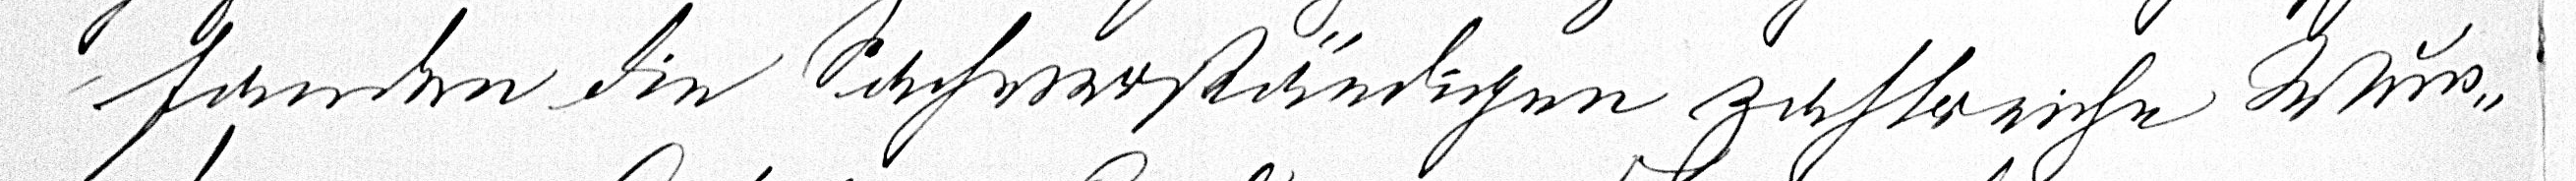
sanden die Sachverständigen zahlreiche Wur¬
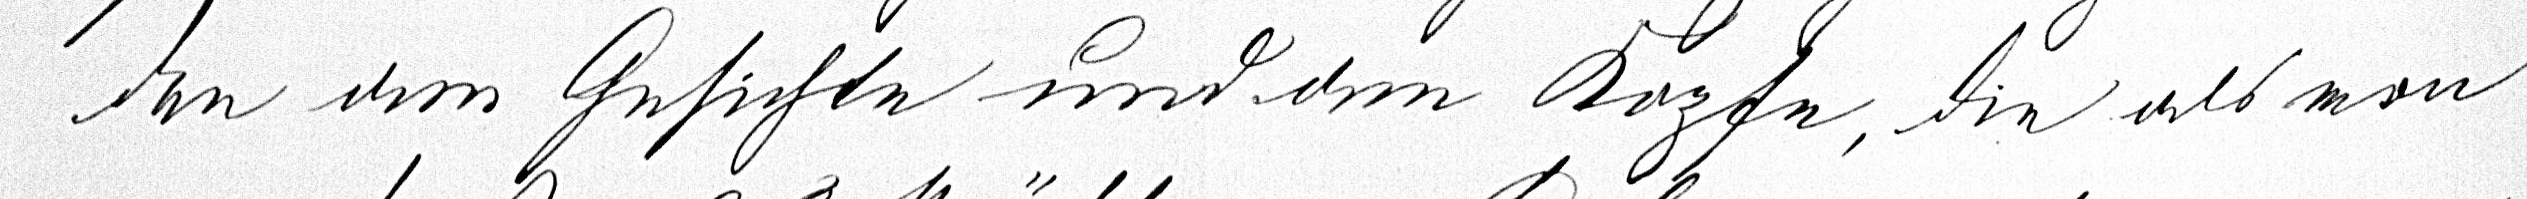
den am Gesichte und den Kopfe, die als von
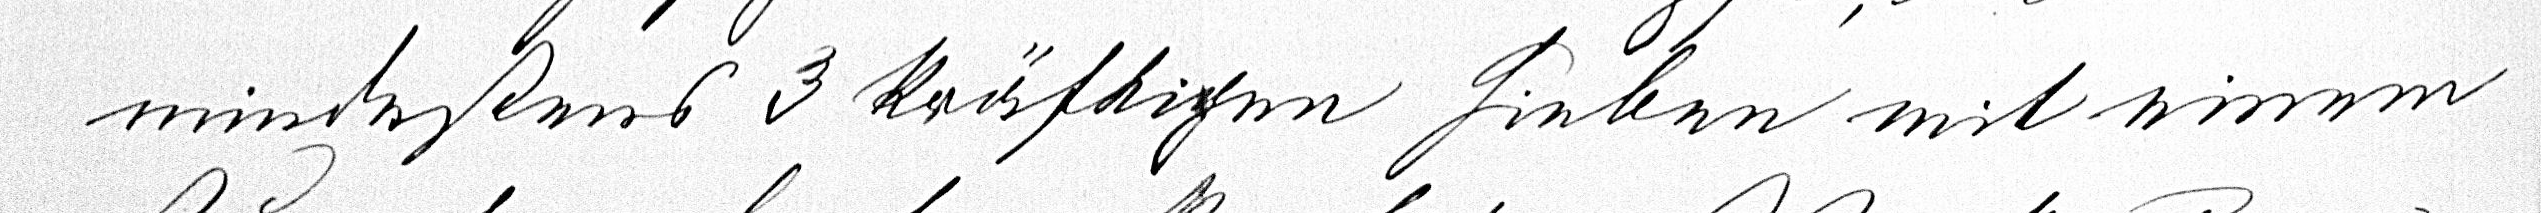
mindestens 3 kräftigen hieben mit einem
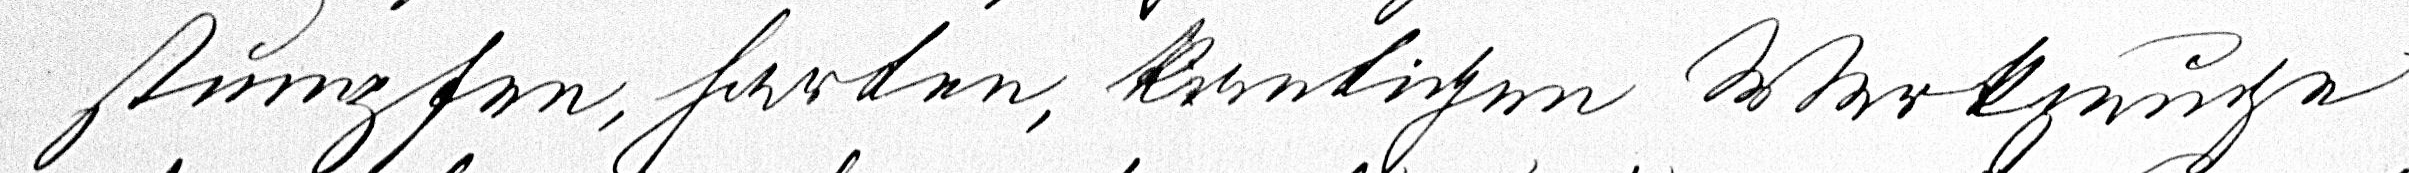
stumpfen, harten, kantigen Werkzeuge
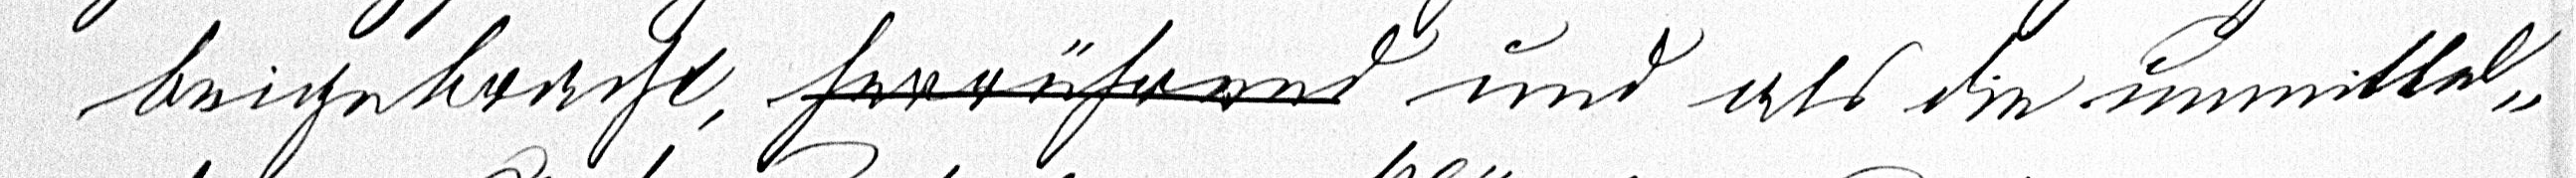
beigebracht, und als die unmittel¬
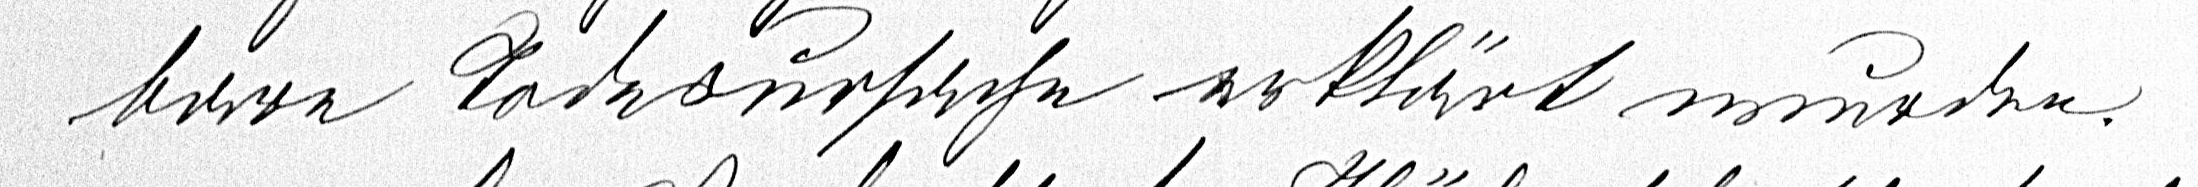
bare Todesursache erklärt wurden.
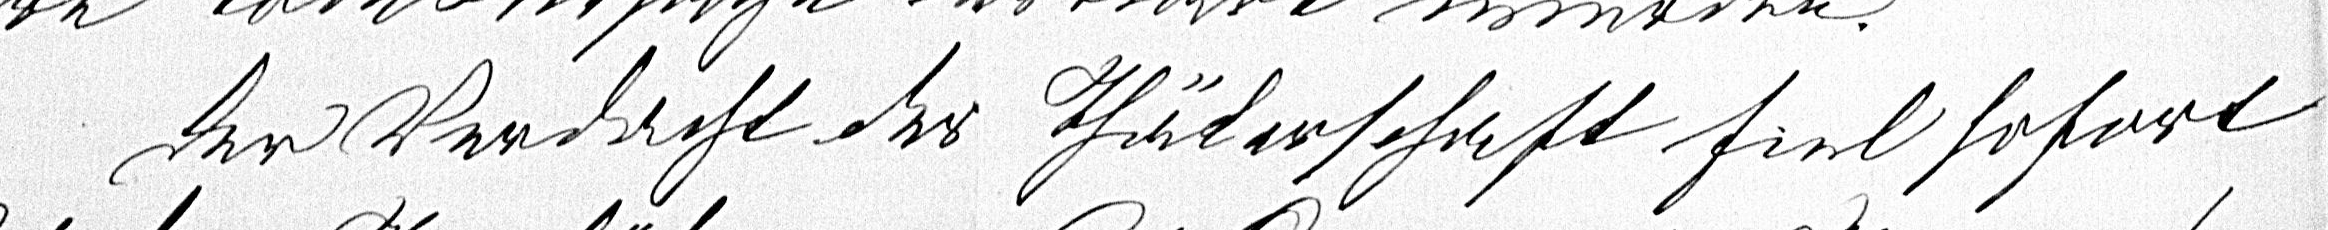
Der Verdacht der Thäterschaft fiel sofort
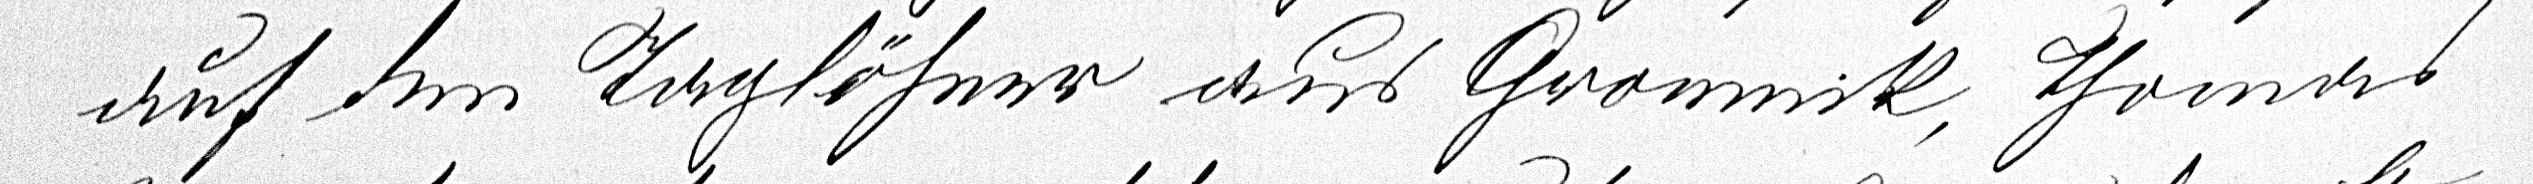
auf den Taglöhner aus Gromnik, Thomas
